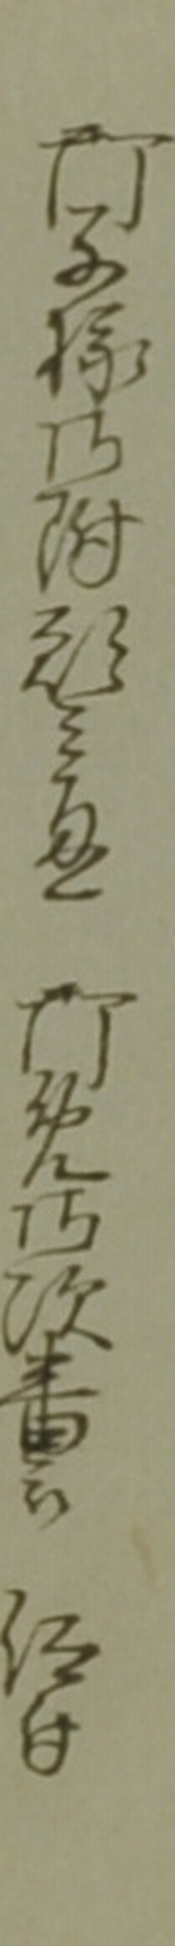御子様御附願之通御免御次番被仰付
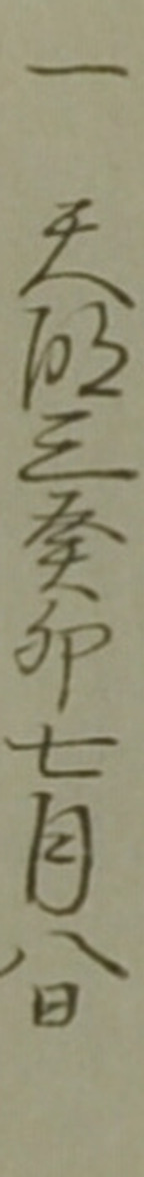一天明三癸卯七月八日
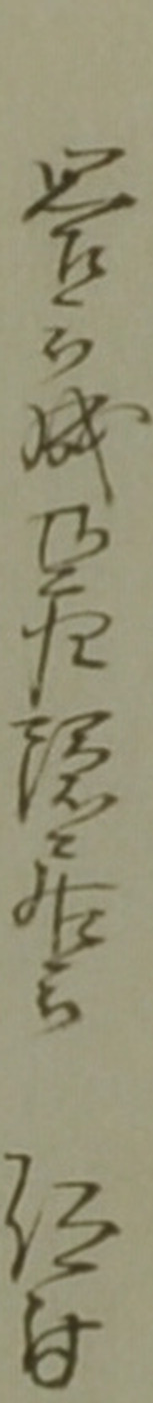思召被成御座隠居被仰付
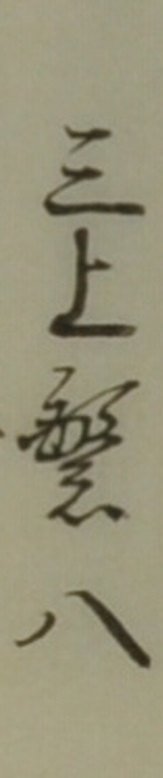三上繁八
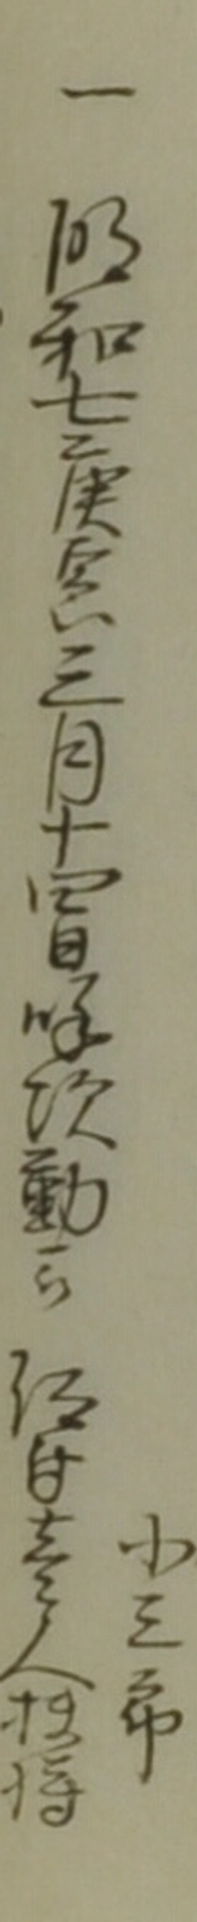一明和七庚寅三月十四日呼次勤被仰付壱人扶持
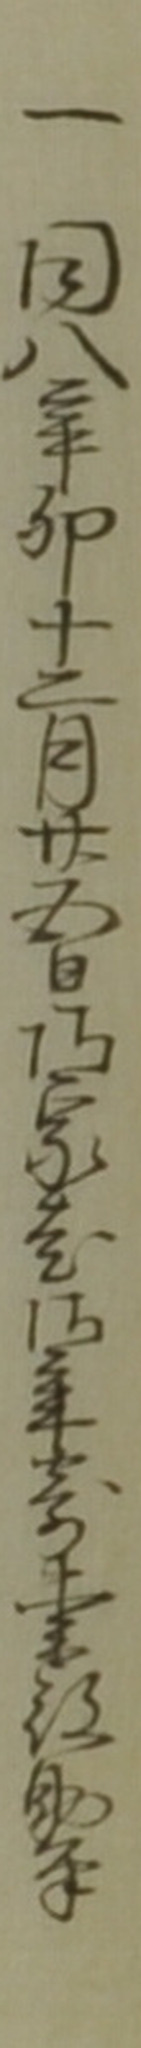一同八辛卯十二月廿五日御家老御年寄書役助筆
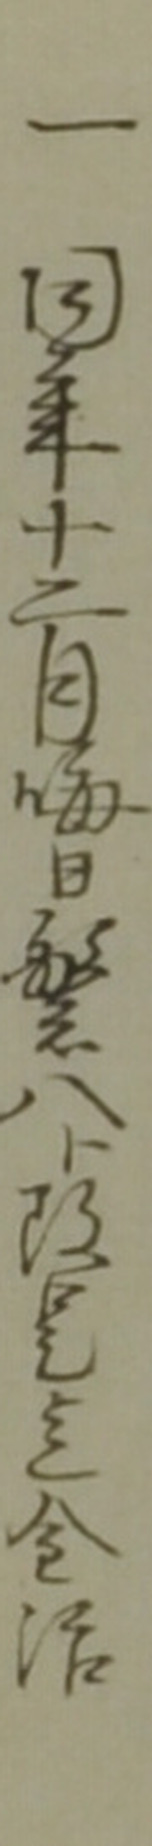一同年十二月晦日繁八改是迄金治
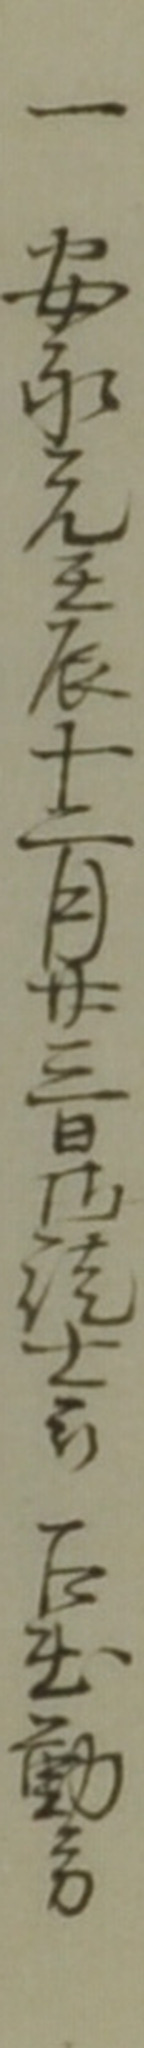一安永元壬辰十二月廿三日御徒士被召出勤方
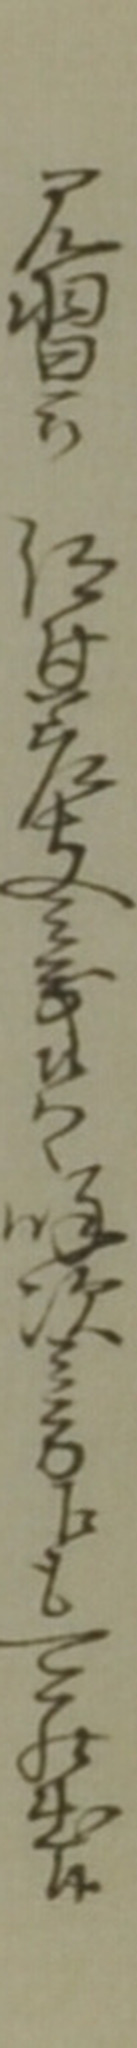見習被仰付差支之義候ハヽ呼次之方江も可罷出候
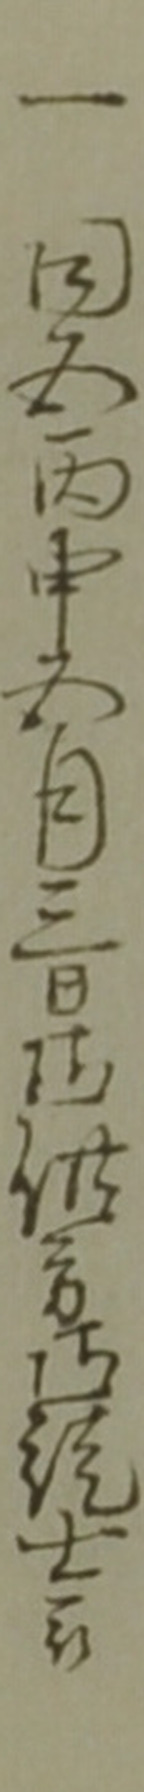一同五丙申五月三日御供方御徒士被
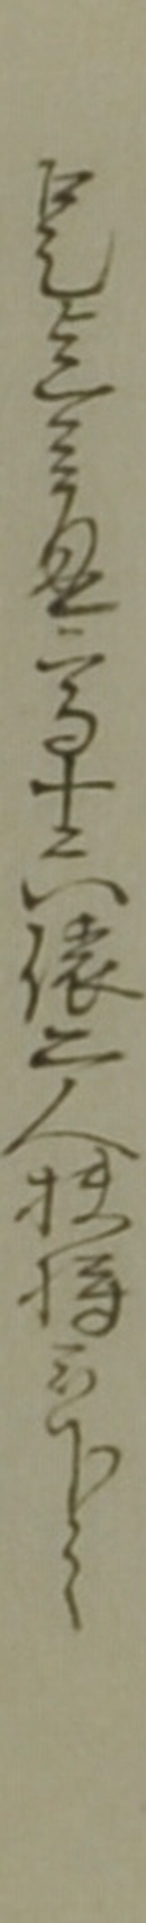是迄之通高十六俵二人扶持被下之
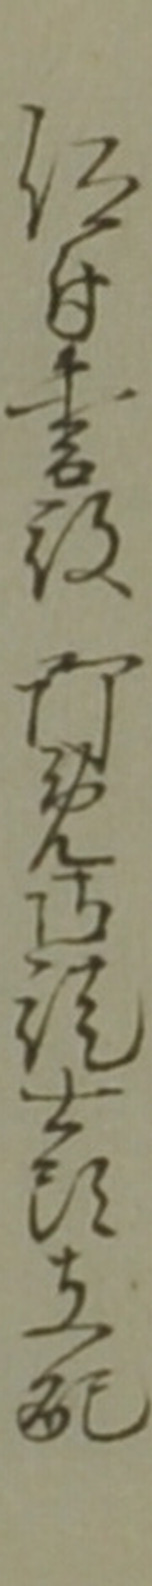仰付書役御免御徒士頭支配
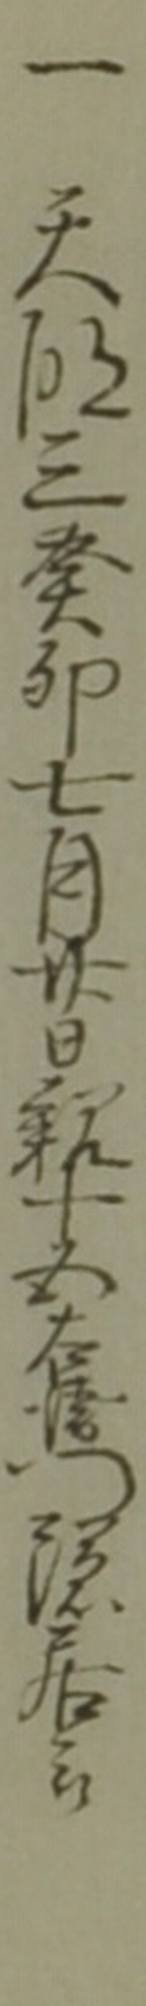一天明三癸卯七月廿日親十五右衛門隠居被
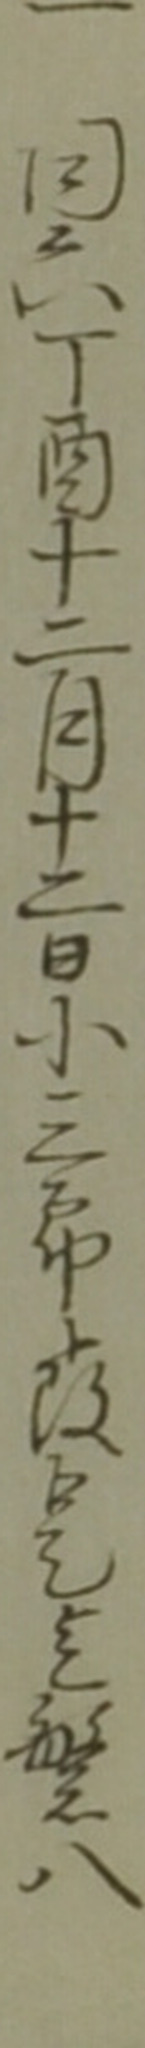一同六丁酉十二月十二日小三郎改是迄繁八
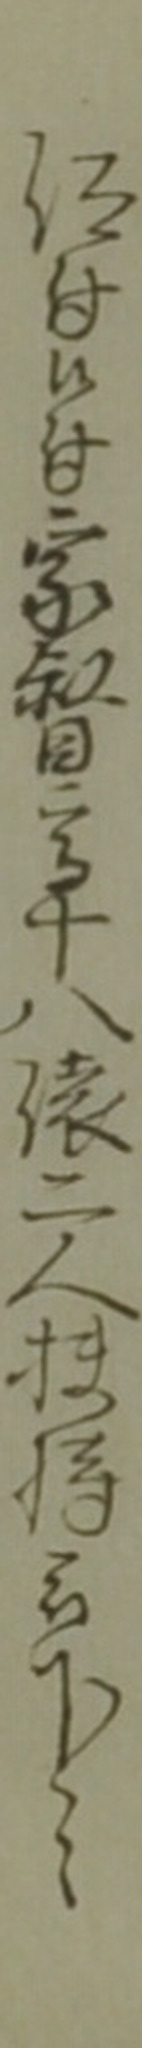仰付候付家督高十八俵二人扶持被下之
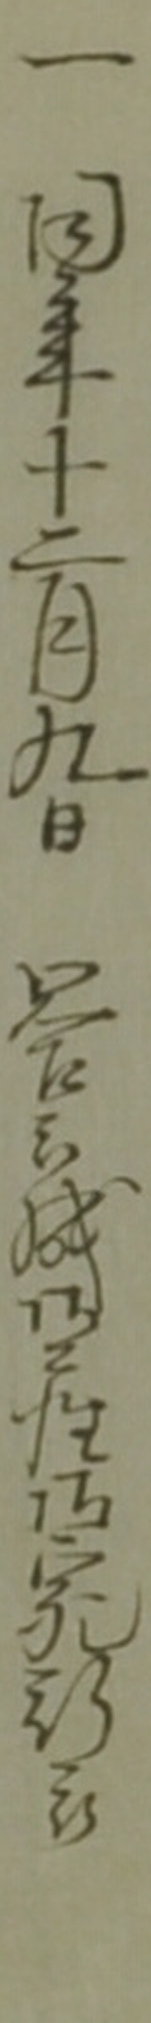一同年十二月九日思召被成御座御宛行被
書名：無足廃家（弐）
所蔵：伊那市立高遠町図書館・合同会社AMANE
